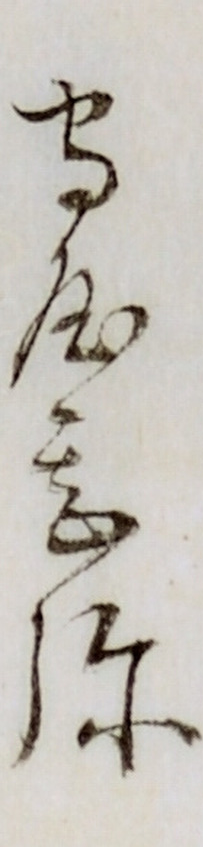守屋甚弥
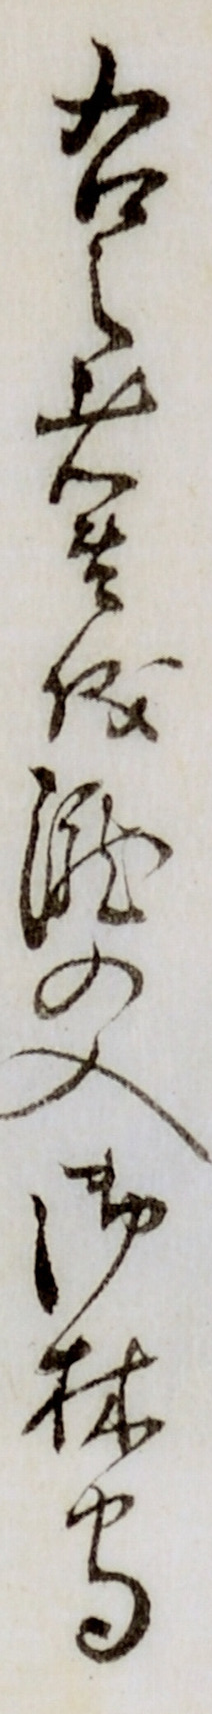右之者共儀滝の入御林守
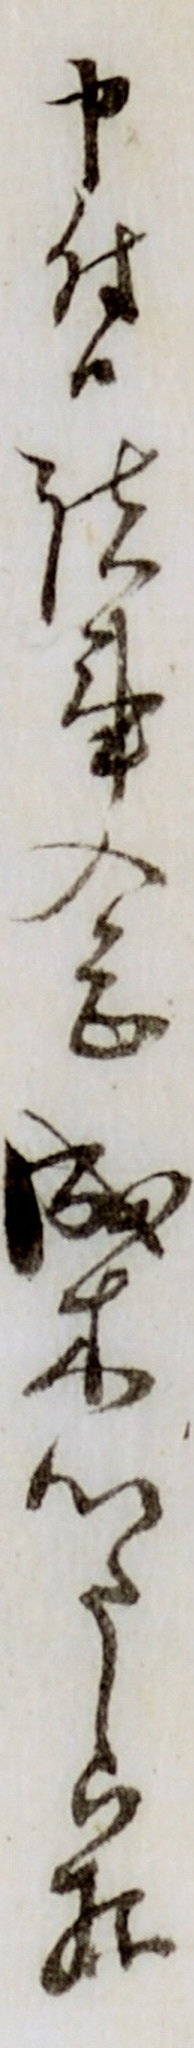申付候諸事入念成木いたし候様
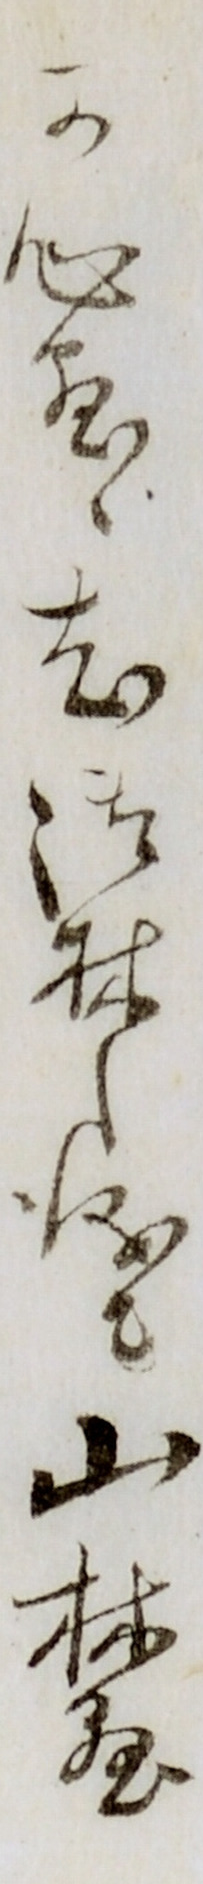可心懸候尤御林之儀は山林懸
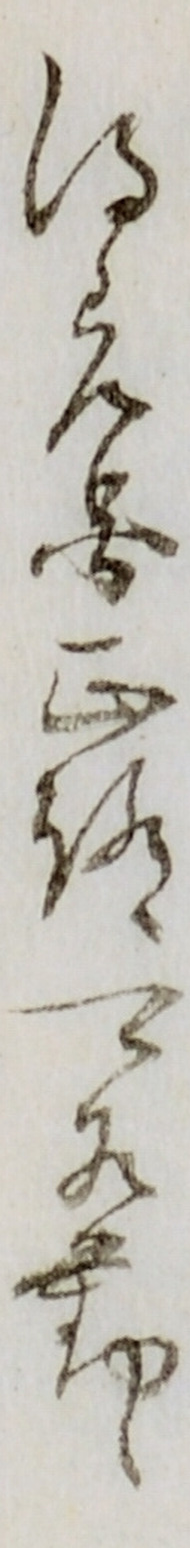得差図正路に可相勤候
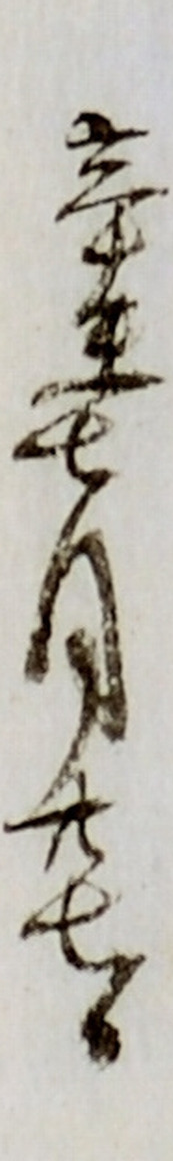辛未七月廿七日
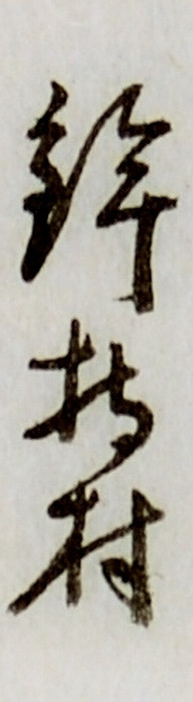鉾持村
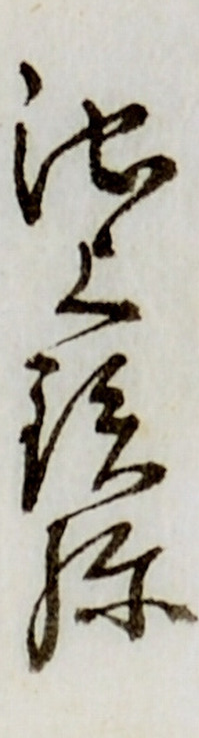池上鉄弥
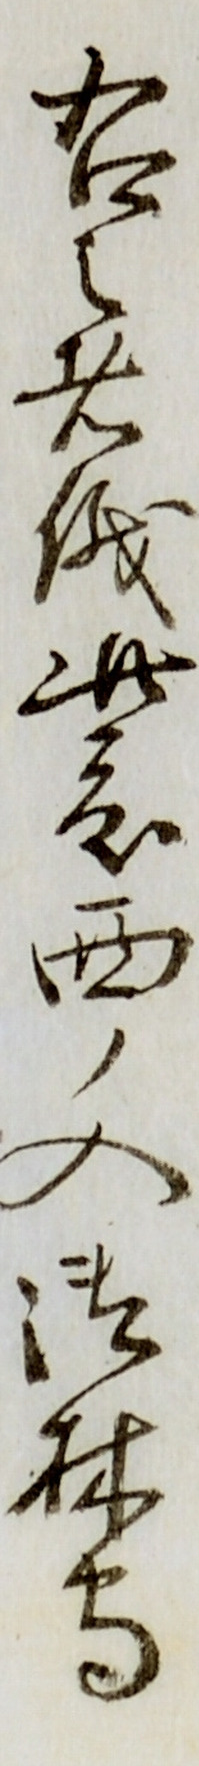右之者儀此度西ノ入御林守
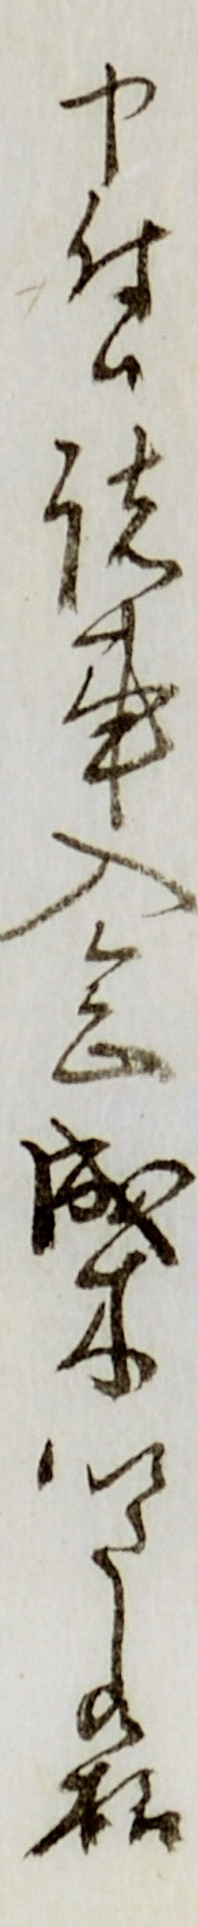申付候諸事入念成木いたし候様
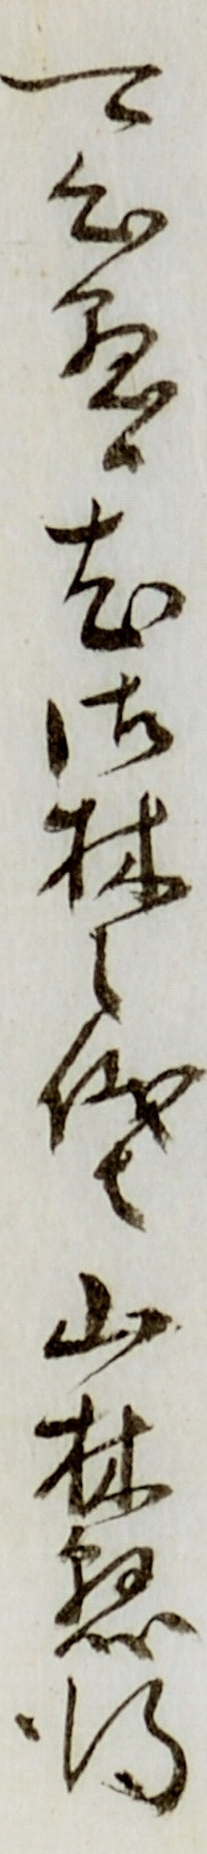可心懸候尤御林之儀は山林懸
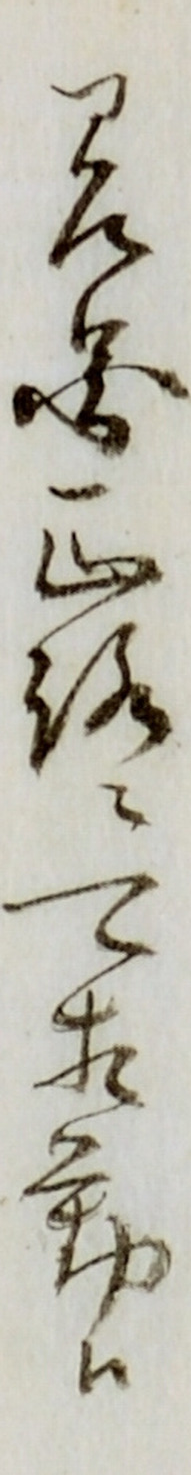差図正路に可相勤候
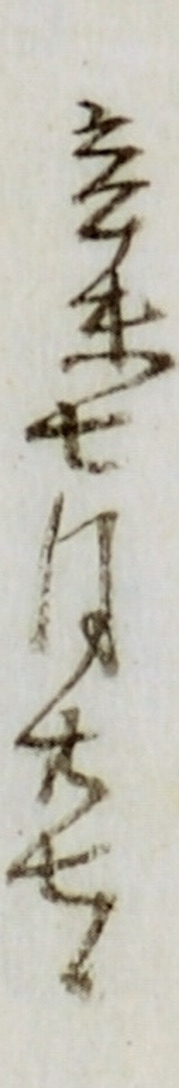辛未七月廿七日
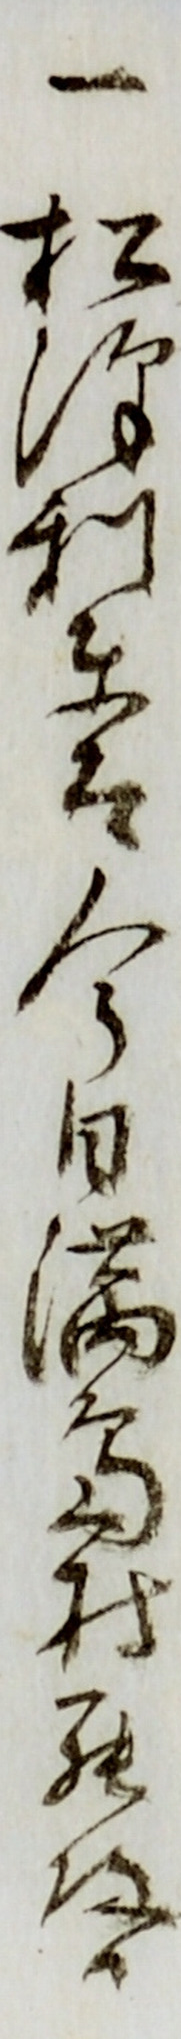一松沢利東太今日満島村罷帰候
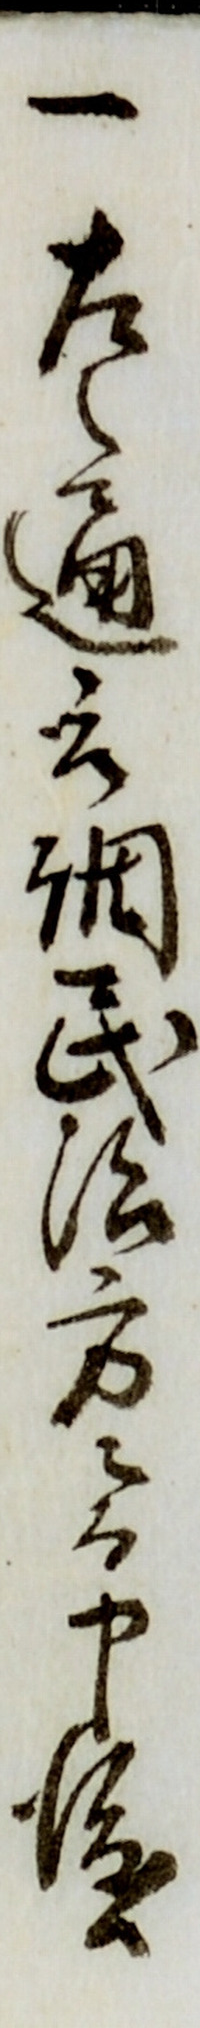一左之通取調民治方にて申渡候
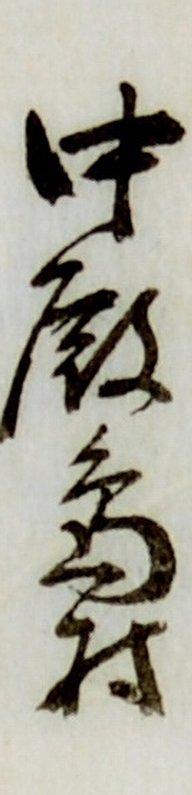中殿島村
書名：山林方諸事御用留
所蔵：伊那市立高遠町図書館・合同会社AMANE
